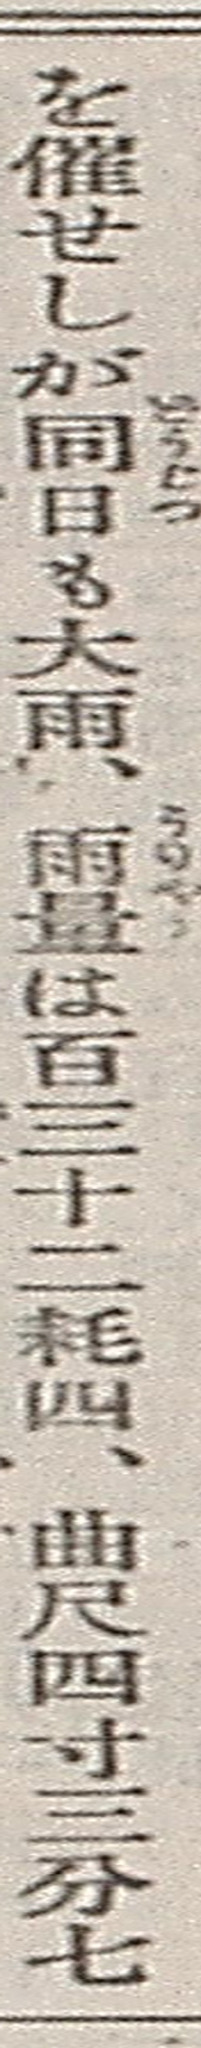を催せしが同日も大雨、雨量は百三十二粍四、曲尺四寸三分六
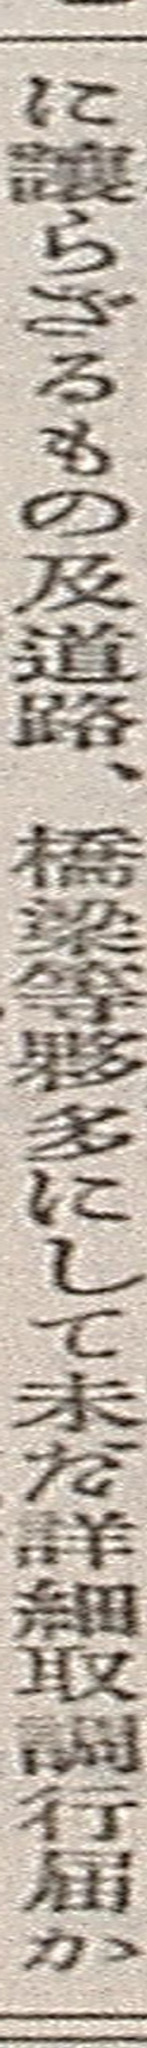に譲らざるもの及道路、橋梁等夥多にして未だ詳細取調行届か
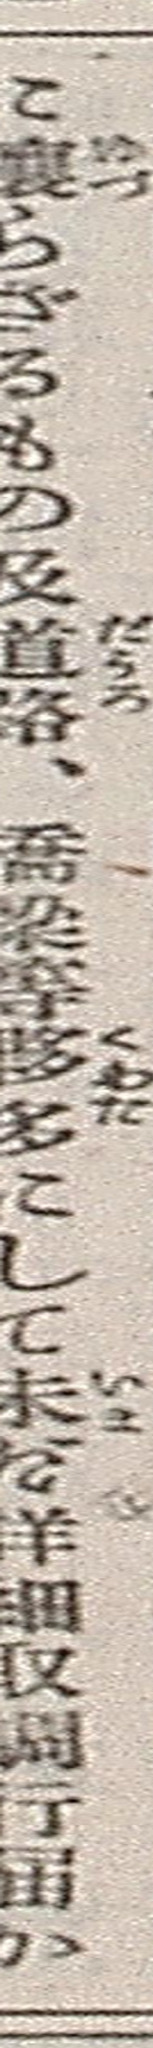に譲らざるもの及道路、橋梁等夥多にして未だ詳細取調行届か
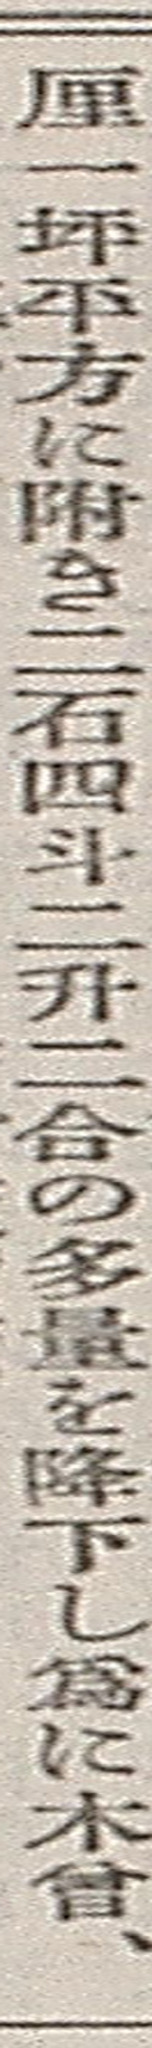厘一坪平方に附き二石四斗二升二合の多量を降下し為に木曽、
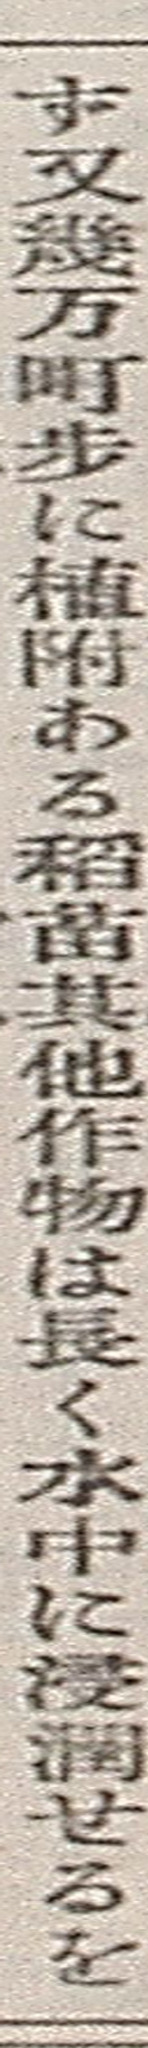ず又幾万町歩に植附ある稲苗其他作物は長く水中に浸潤せるを
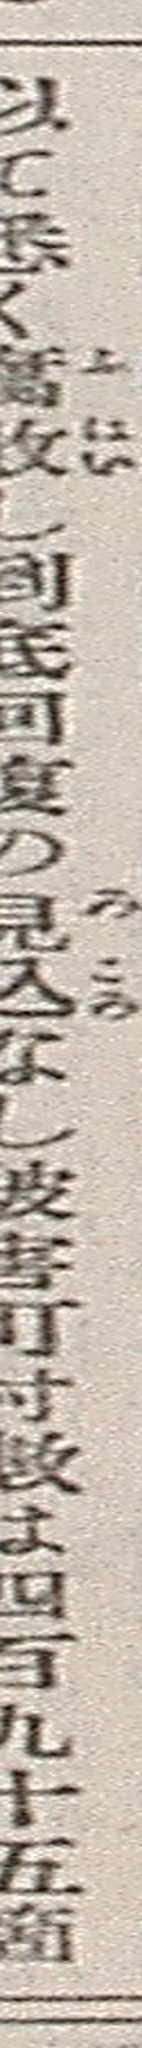以て悉く腐敗し到底回復の見込なし被害町村数は四百九十五箇
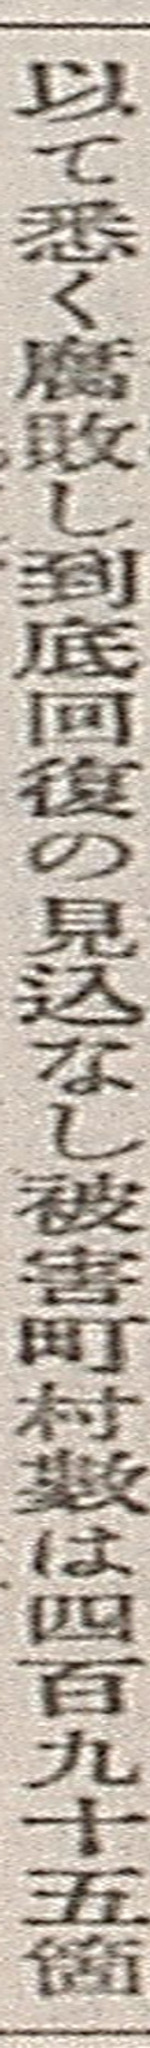以て悉く腐敗し到底回復の見込なし被害町村数は四百九十五箇
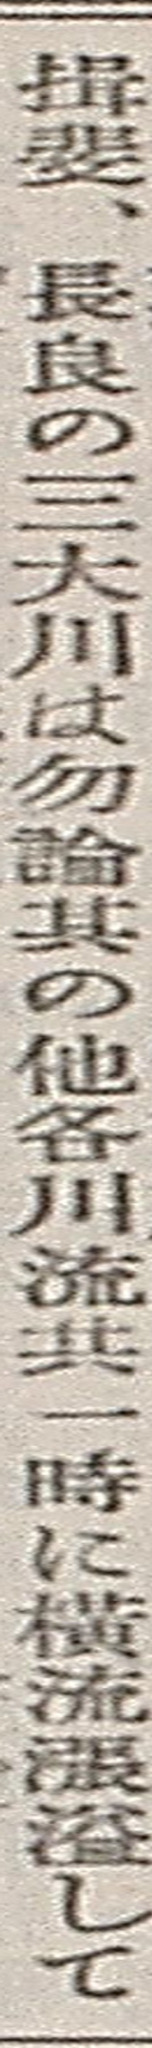揖斐、長良の三大川は勿論其の他各川流共一時に横流漲溢して
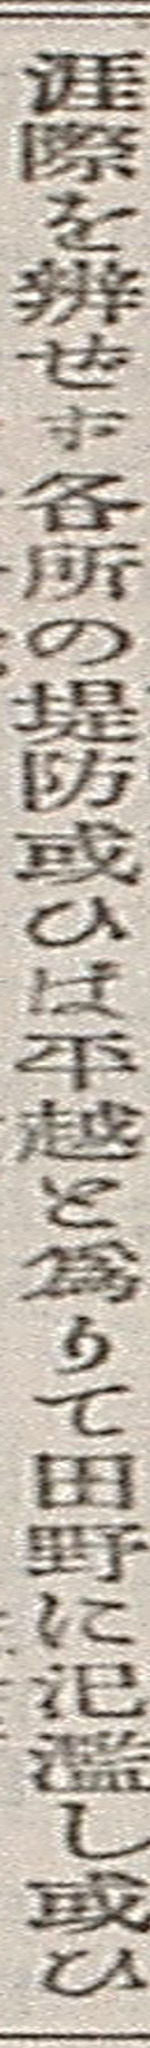涯際を辨ぜず各所の堤防或ひは平越と為りて田野に氾濫し或ひ
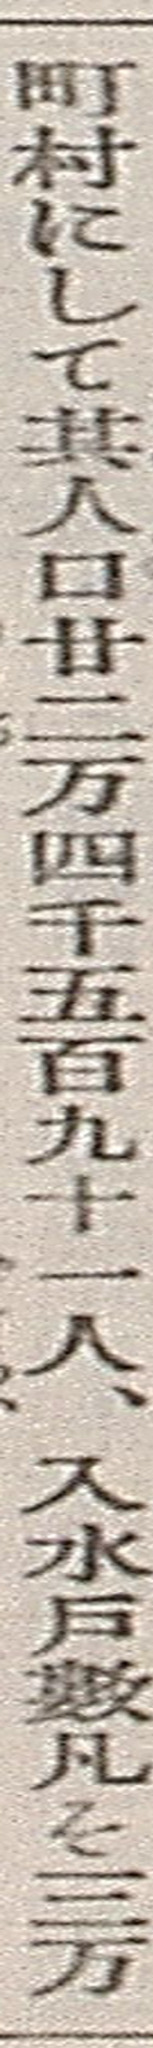町村にして其人口廿二万四千五百九十一人、入水戸数凡そ三万
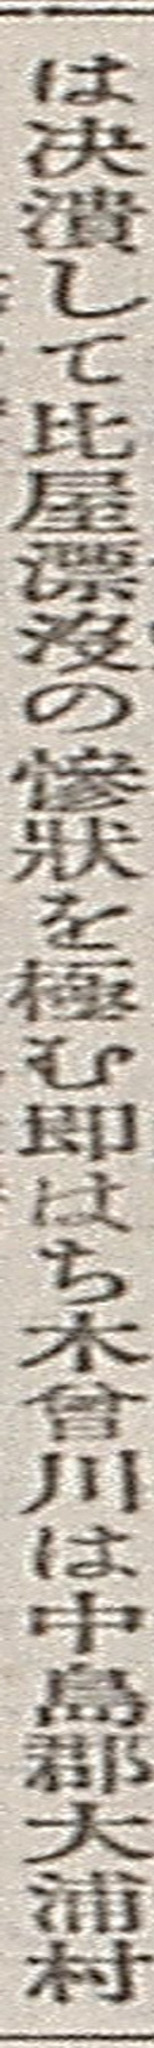は決潰して比屋漂没の惨状を極む即はち木曽川は中島郡大浦村
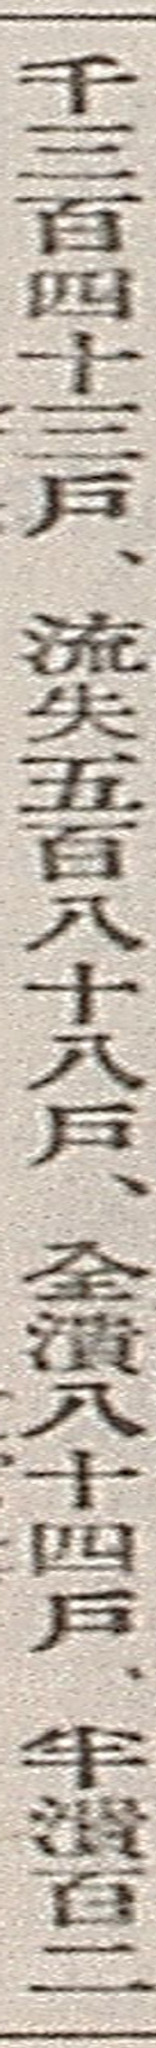千三百四十三戸、流失五百八十八戸、全潰八十四戸、半潰百二
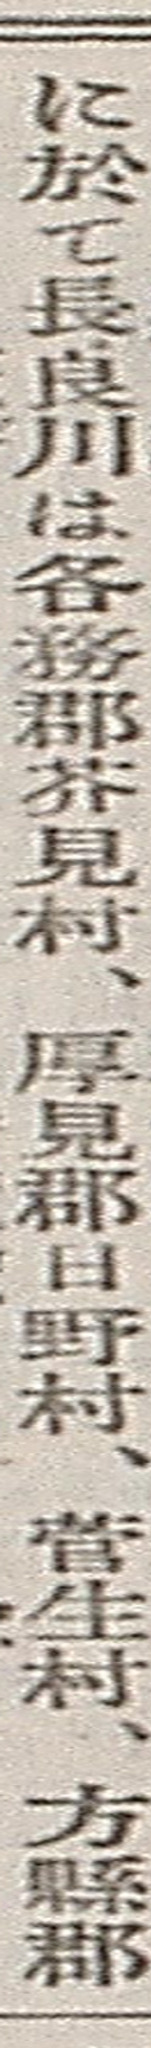に於て長良川は各務郡芥見村、厚見郡は日野村、菅生村、方縣郡
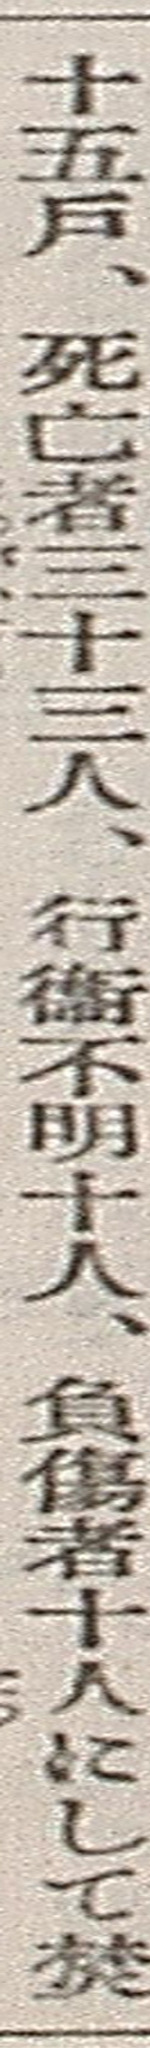十五戸、死亡者三十三人、行衛不明十人、負傷者十人にして焚
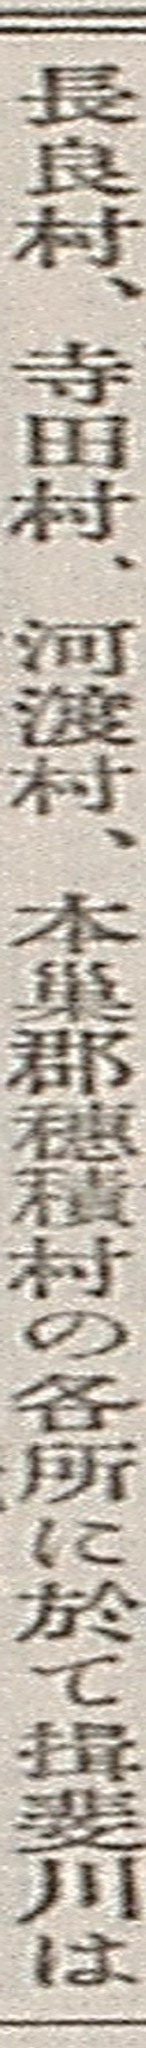長良村、寺田村、河渡村、本巣郡穂積村の各所に於て揖斐川は
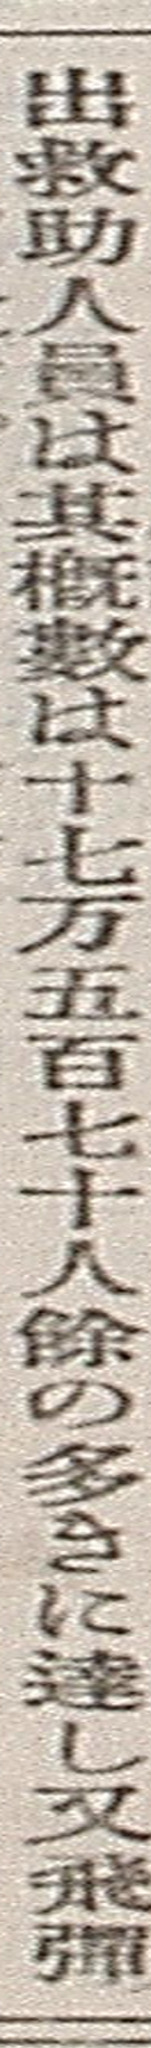出救助人員は其概数は十七万五百七十人餘の多きに達し又飛騨
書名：風俗畫報臨時増刊第百二十六號　洪水被害録（中）
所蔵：東京大学地震研究所図書室 Earthquake Research Institute Library, The University of Tokyo, JAPAN
